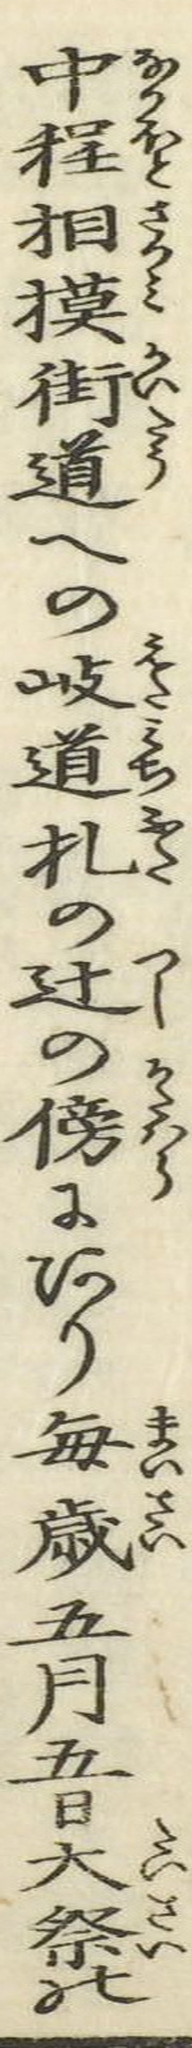中程相摸街道への岐道札の辻の傍にあり毎歳五月五日大祭の
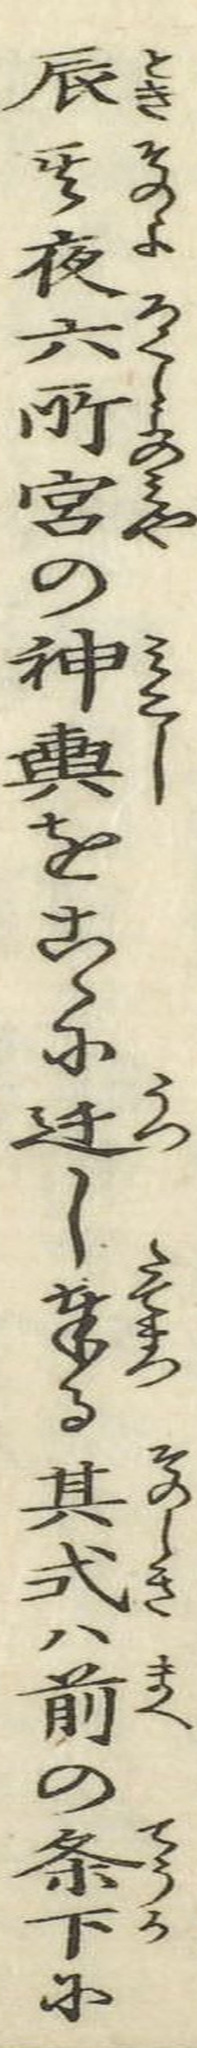辰其夜六所宮の神輿をこゝに遷し奉る其式は前の条下に
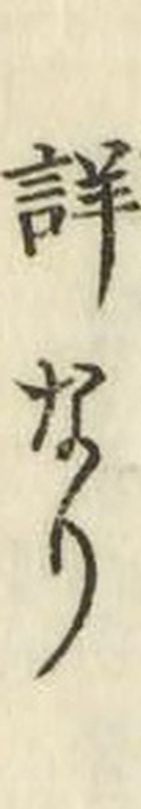詳なり
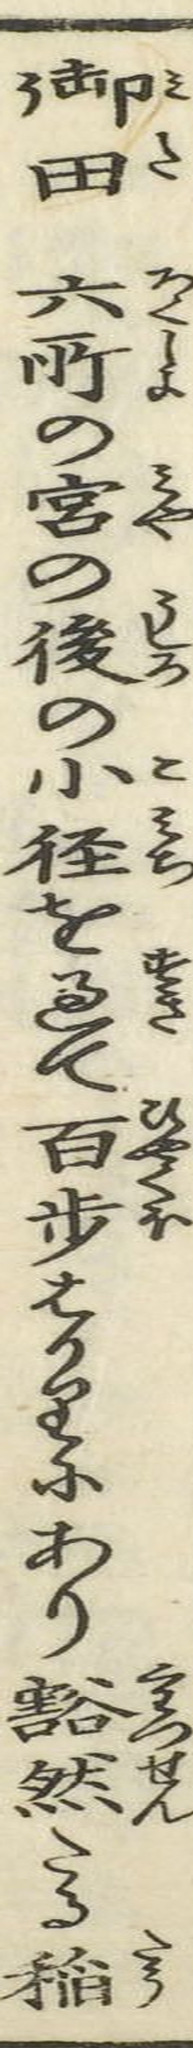御田六所の宮の後の小径を過て百歩はかりにあり豁然たる稲
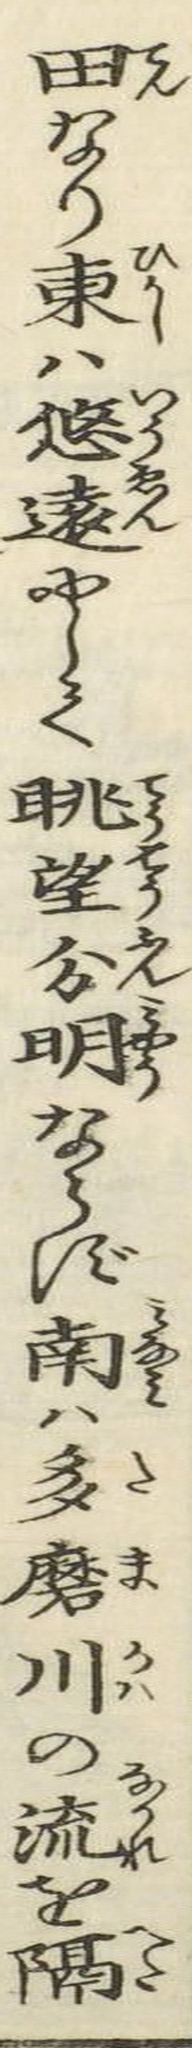田なり東は悠遠にして眺望分明ならず南は多磨川の流を隔
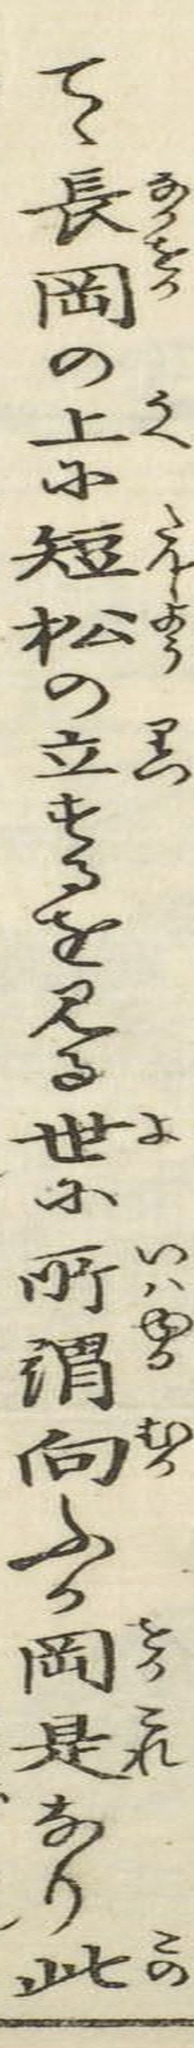てゝ長岡の上に短松の立するを見る世に所謂向ふか岡是なり此
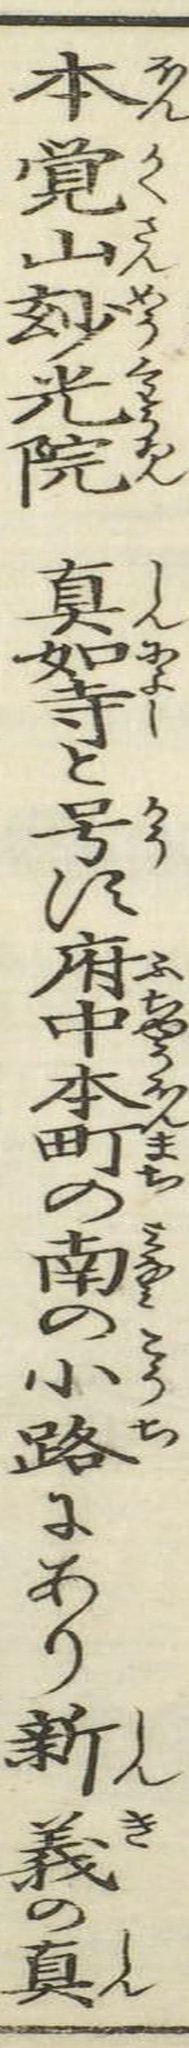本覚山玅光院真如寺と号す府中本町の南の小路にあり新義の真
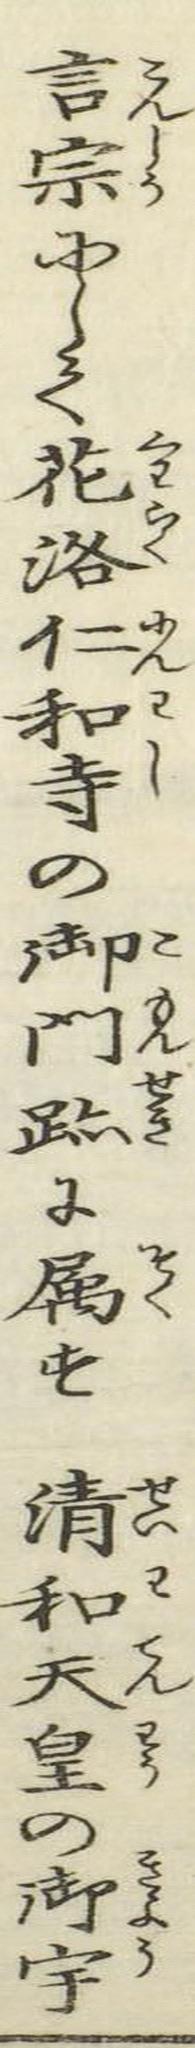言宗にして花洛仁和寺の御門跡に属す清和天皇の御宇
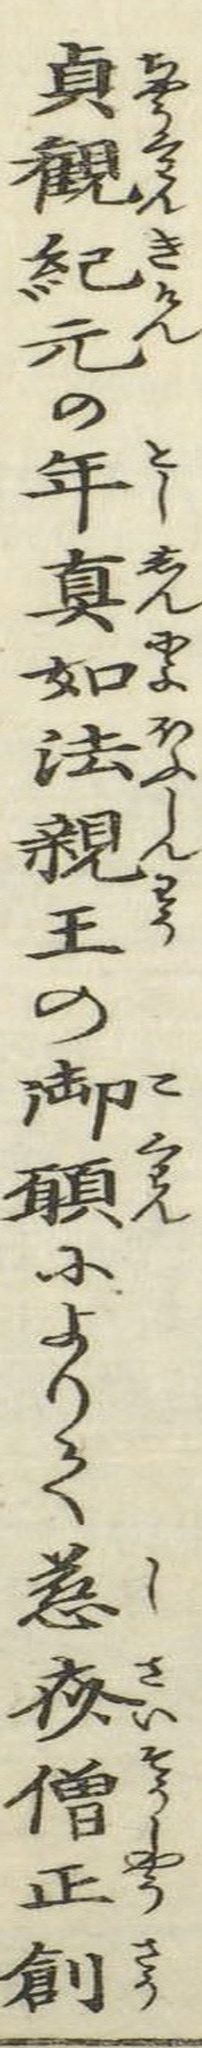貞観紀元の年真如法親王の御願によりて慈斉僧正創
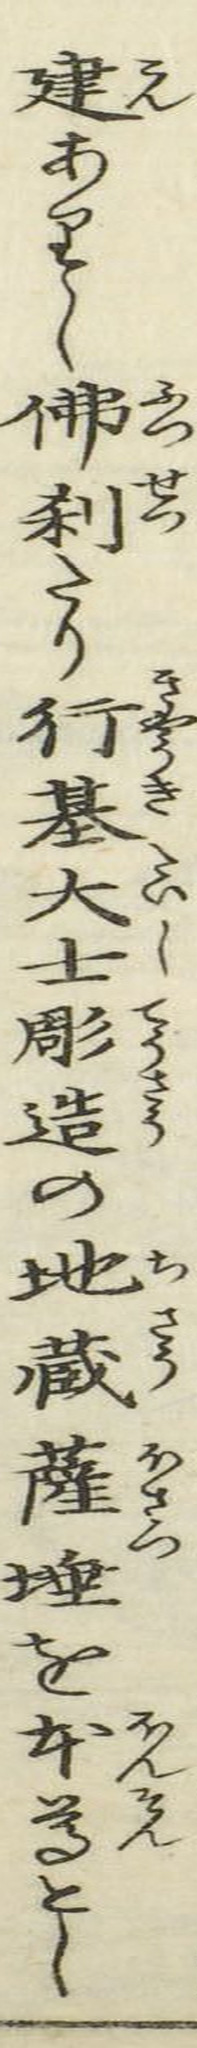建ありし佛刹たり行基大士彫造の地蔵薩埵を本尊とし
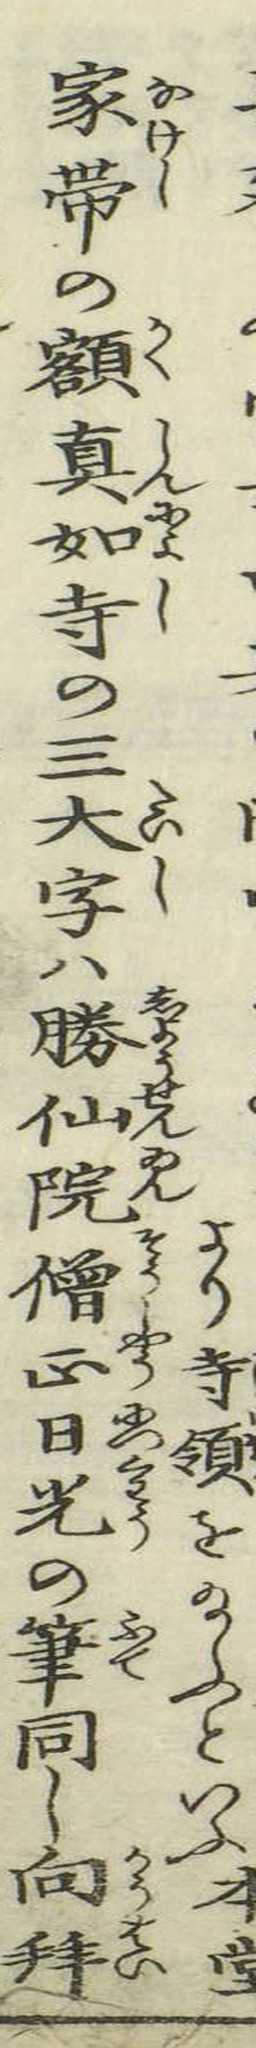家帯の額真如寺の三大字は勝仙院僧正日光の筆同し向拝
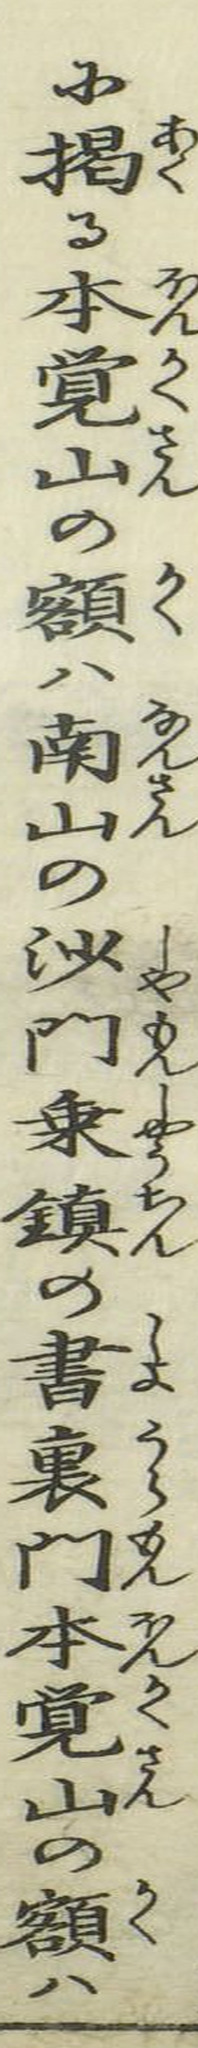に掲る本覚山の額は南山の沙門乗鎮の書裏門本覚山の額は

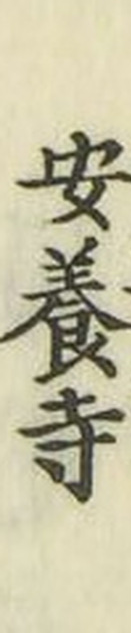安養寺
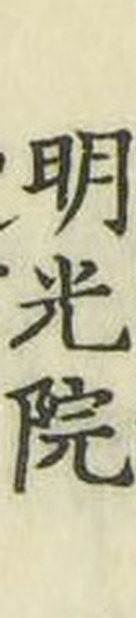明光院

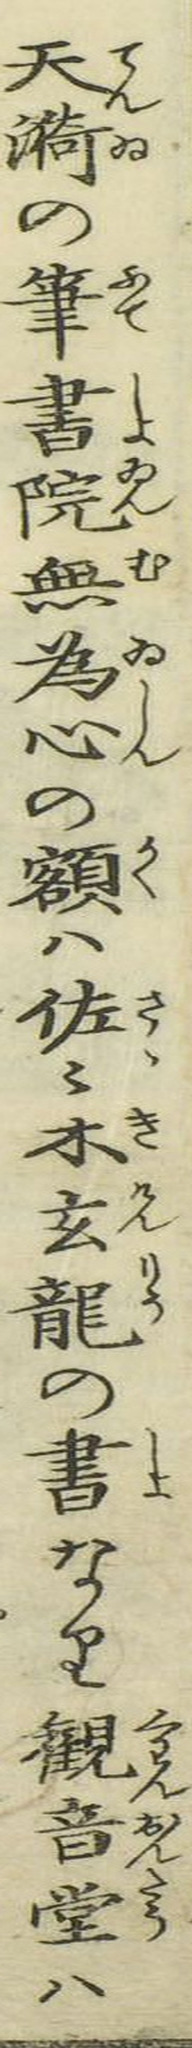天漪の筆書院無為心の額は佐々木玄龍の書なり観音堂は
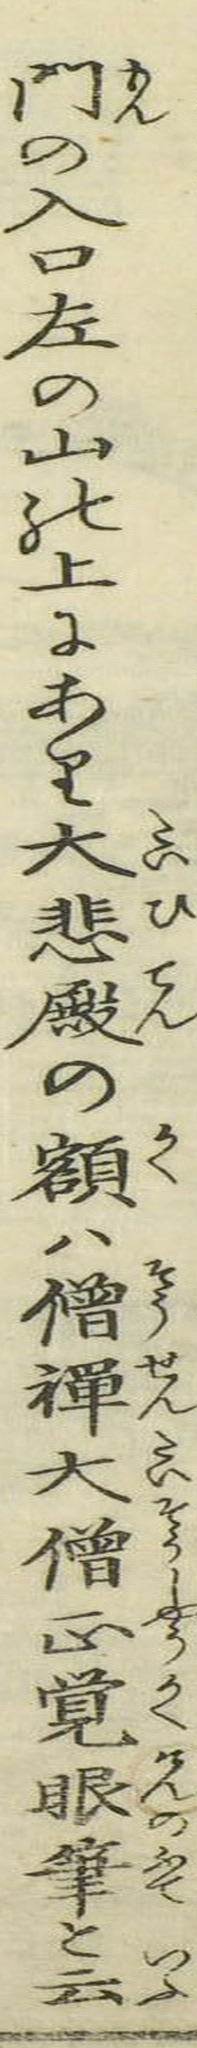門の入口左の山の上にあり大悲殿の額は僧禅大僧正覚眼筆と云
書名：江戸名所図会 20巻 巻之10
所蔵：東京学芸大学教育コンテンツアーカイブ
